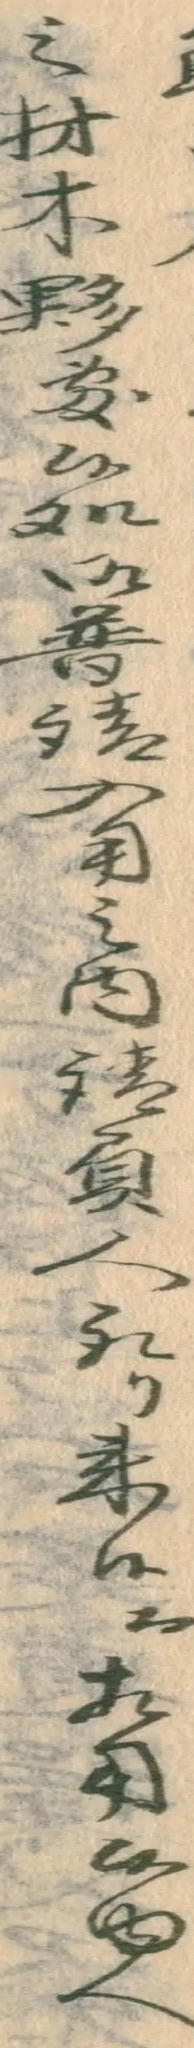之材木夥敷候処御普請入用之内請負人取り来候而相用候ゆへ
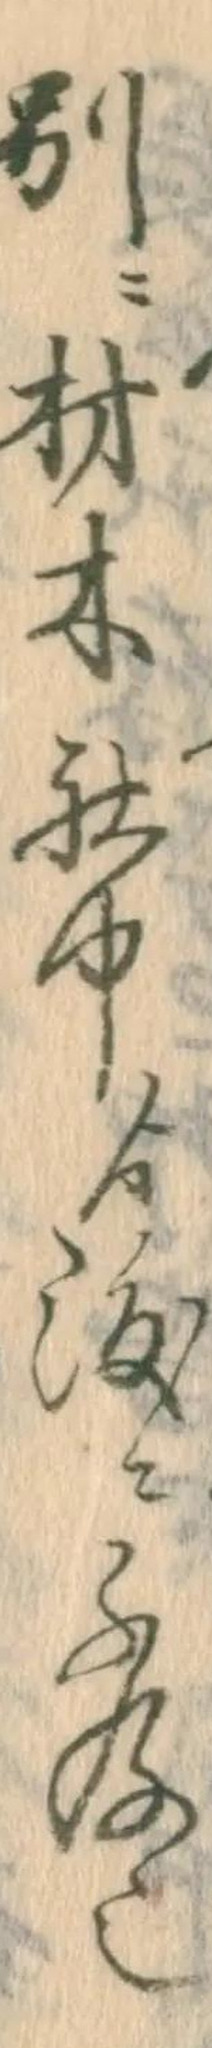別ニ材木社中ゟ渡ニ不及也
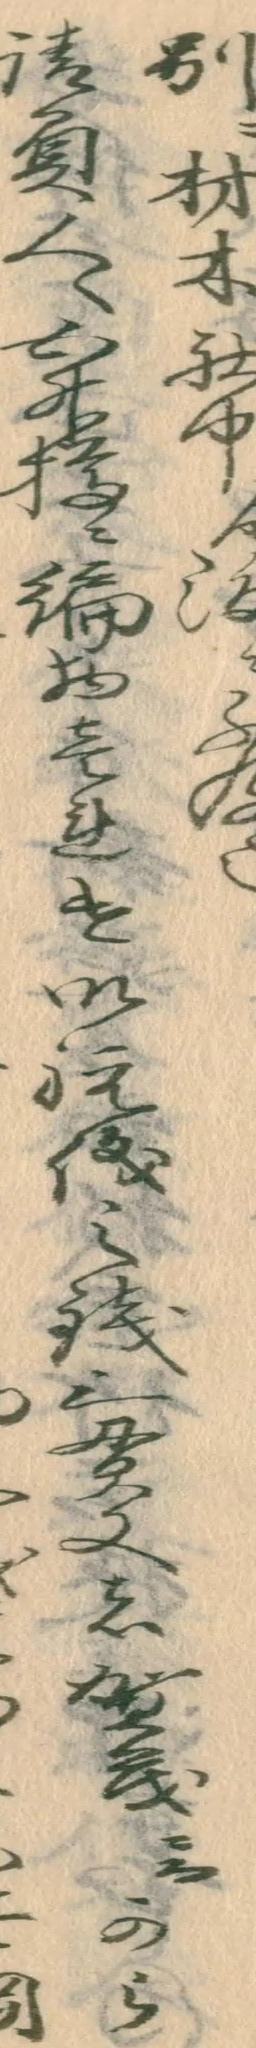一請負人へ五升樽ニ編物壱連遣御祝儀之銭三貫文は賀茂ニ而可被
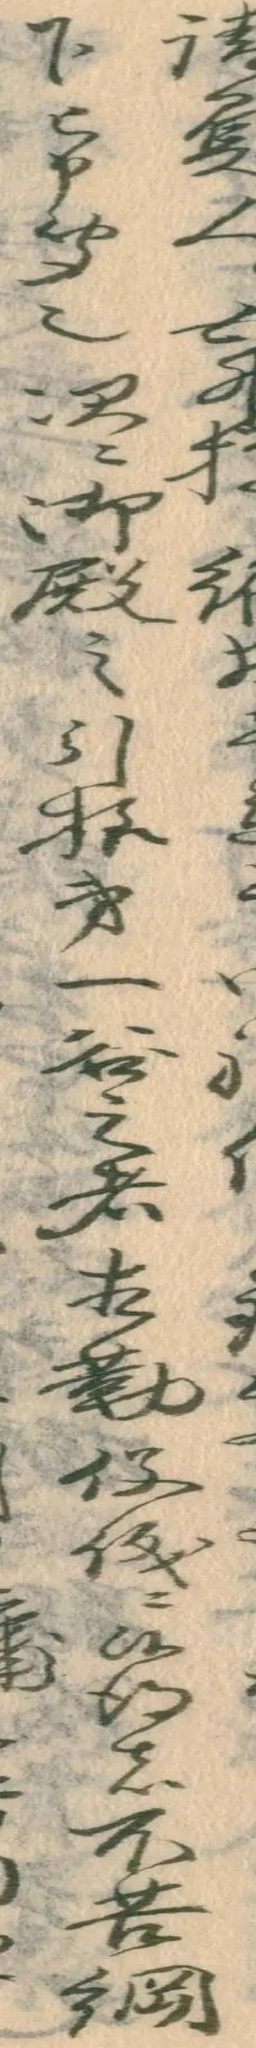下被申聞也次ニ御殿之引様第一谷之者相勤役儀ニ候得は不苦綱
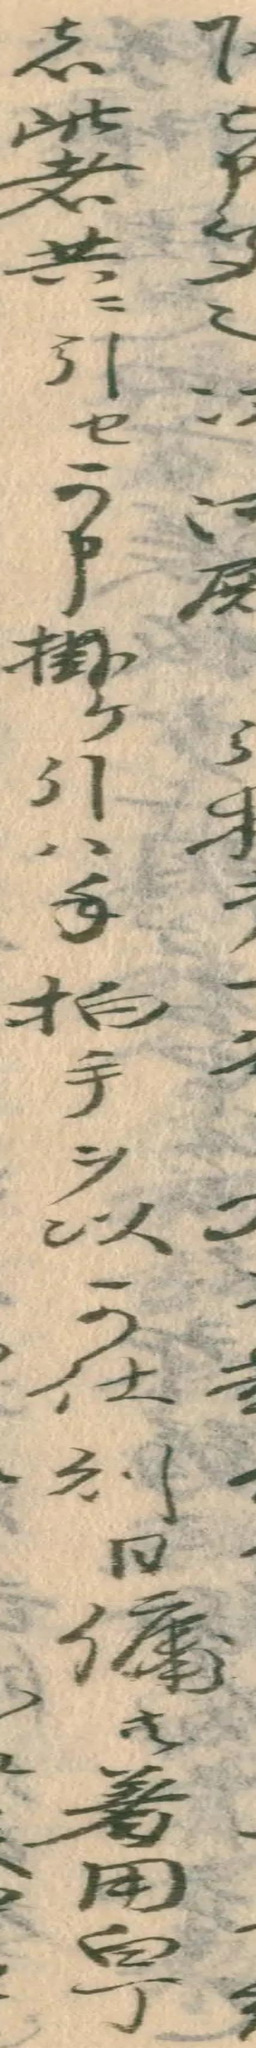は此者共ニ引セ可申掛ケ外ハ手拍手ヲ以可仕則日傭共着用白丁
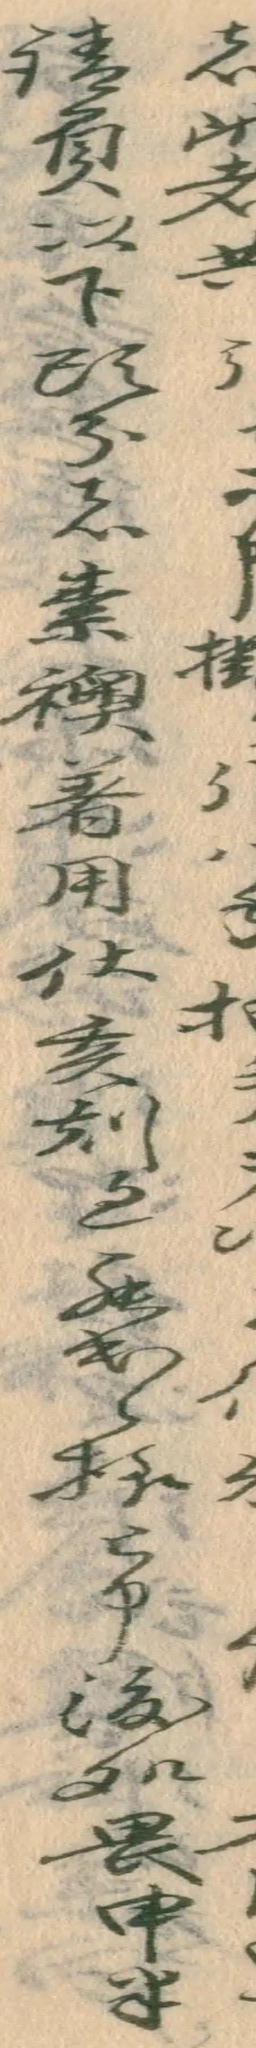請負以下頭分は素襖着用仕亥刻過罷出候様被申渡処畏申半
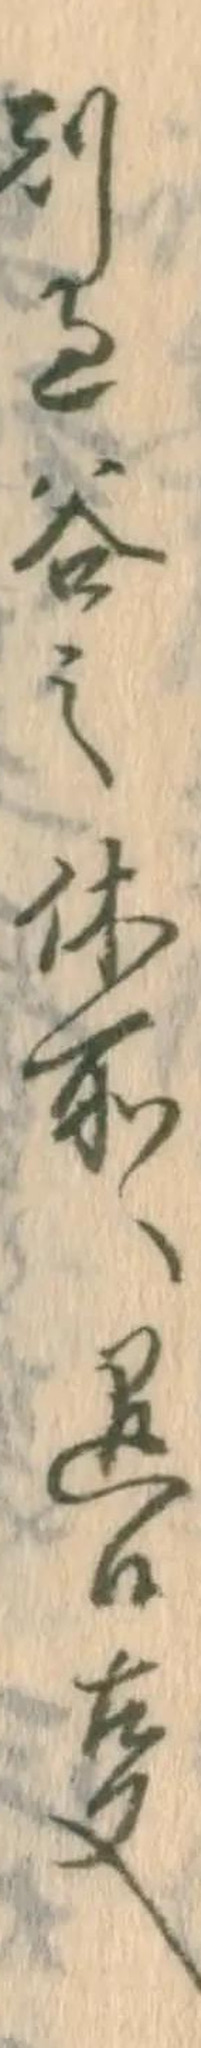刻過谷之休所へ退候事
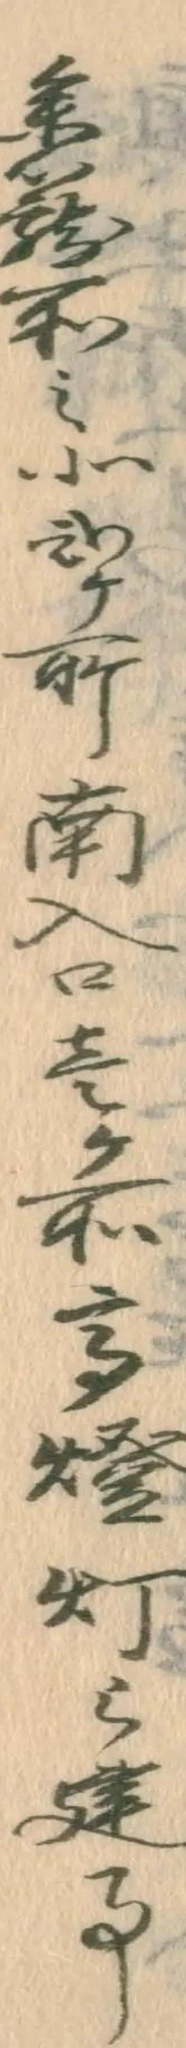一参籠所之北弐ケ所南入口壱ケ所高燈灯被建事
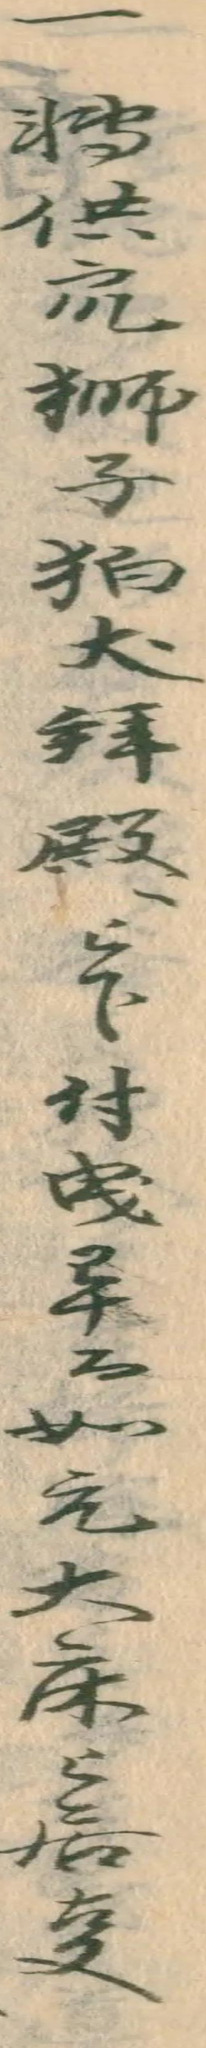一転供衆獅子狛犬拝殿へ被下付曳畢而如元大床被居事
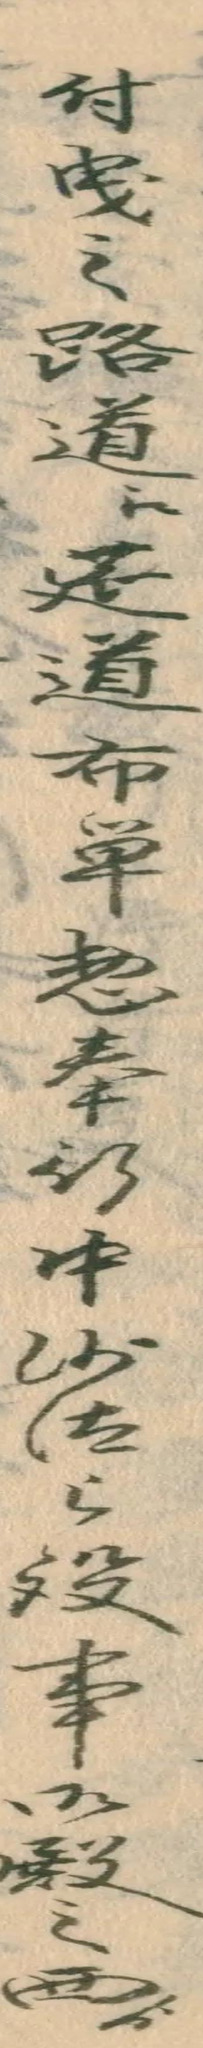一付曳之路道江筵道布単惣奉行中沙汰被設事御殿之西ゟ
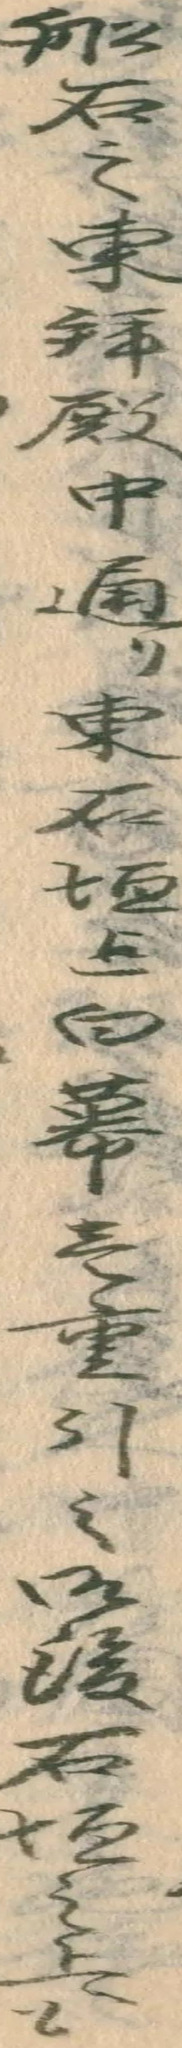船石之東拝殿中通り東石垣迄白幕壱重引之御後石垣之上へも
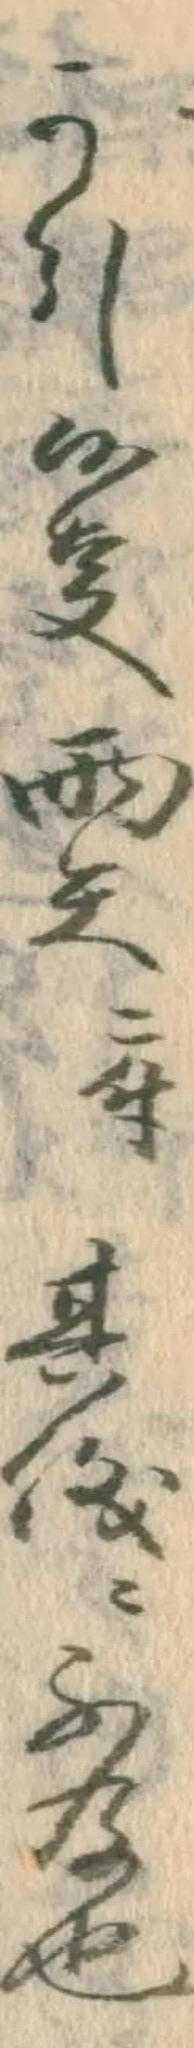可引候事雨天ニ付其儀ニ不及也
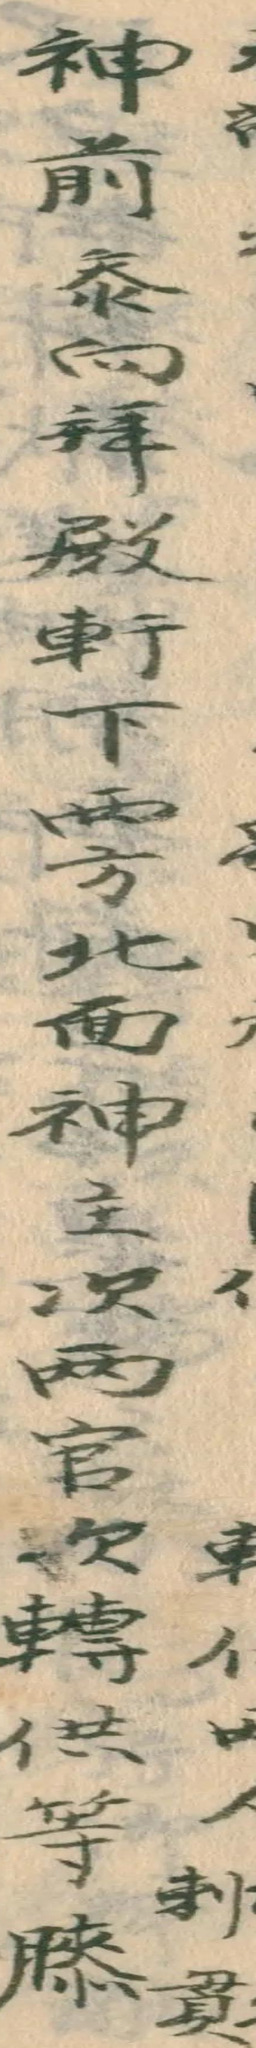神前参向拝殿軒下西方北面神主次両官次転供等膝
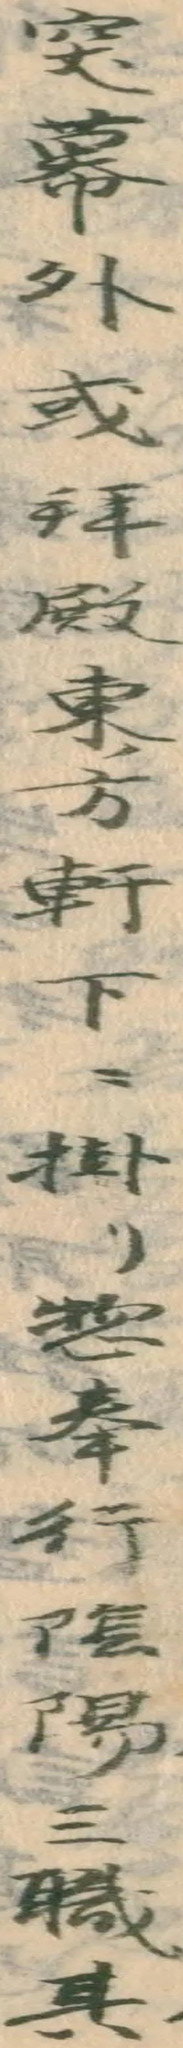突幕外或拝殿東ノ方軒下ニ掛リ惣奉行陰陽三職其
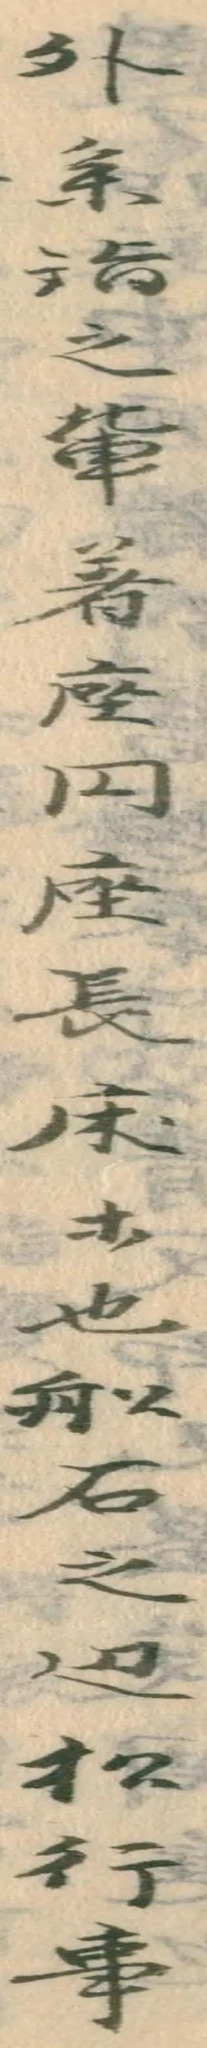外参詣之輩着座円座長床等也船石之辺松行事
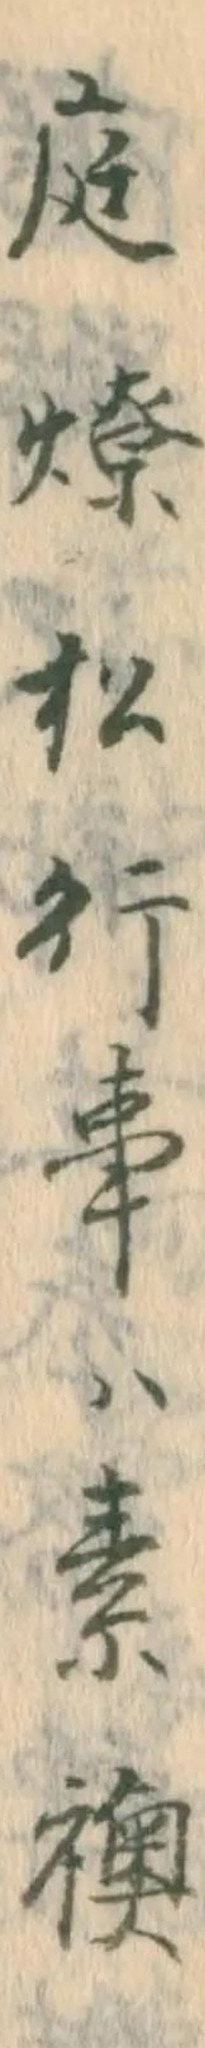庭燎松行事ハ素襖
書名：賀茂社記録. 第17冊
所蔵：国立国会図書館 National Diet Library, JAPAN
